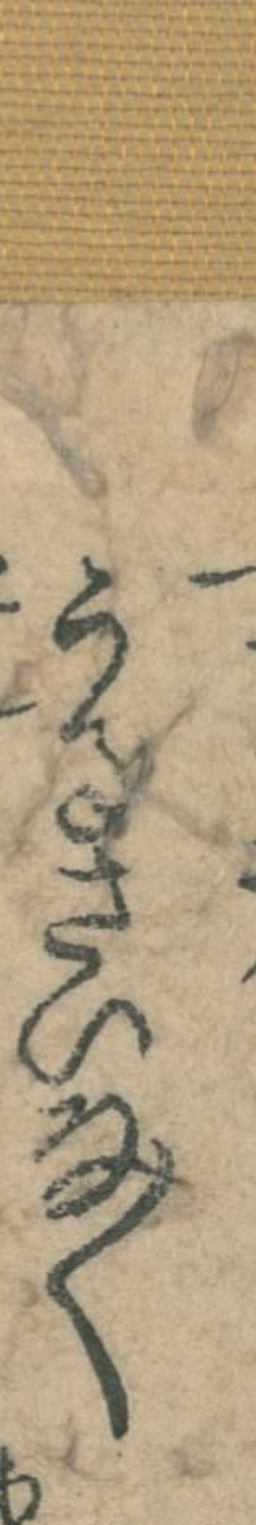うるさいな〳〵
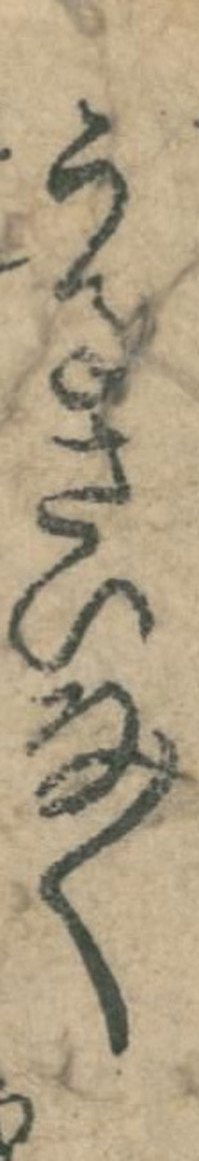うるさいな〳〵
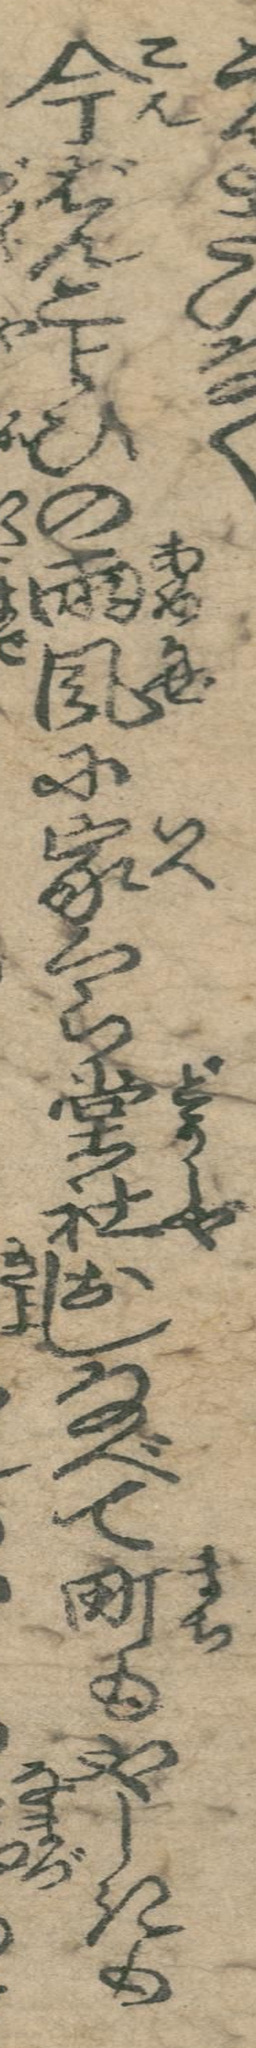今ばんこよひの雨風に家くら堂社おしなべて町もやしきも
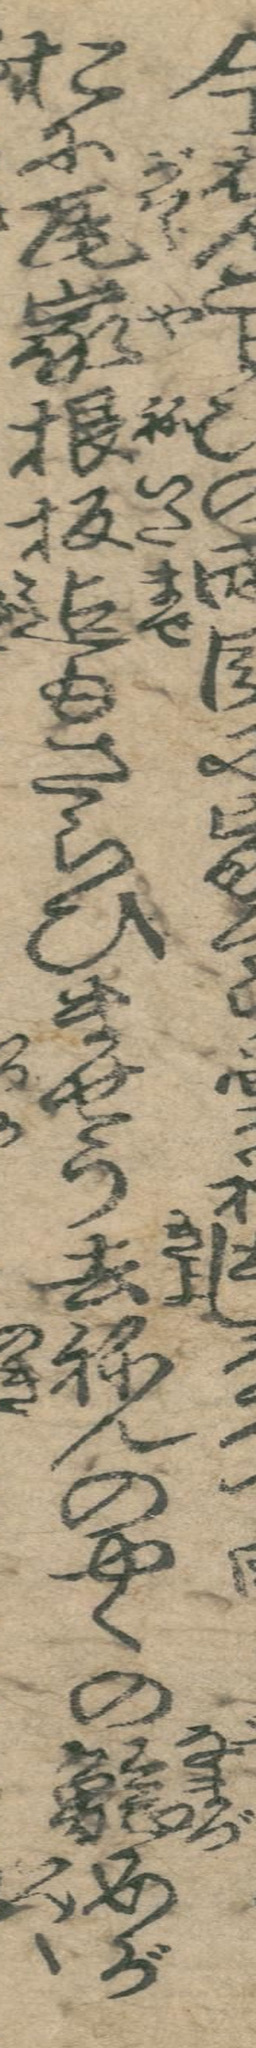おに瓦家根板迄もさらひませう去ねんの如くの鯰めが
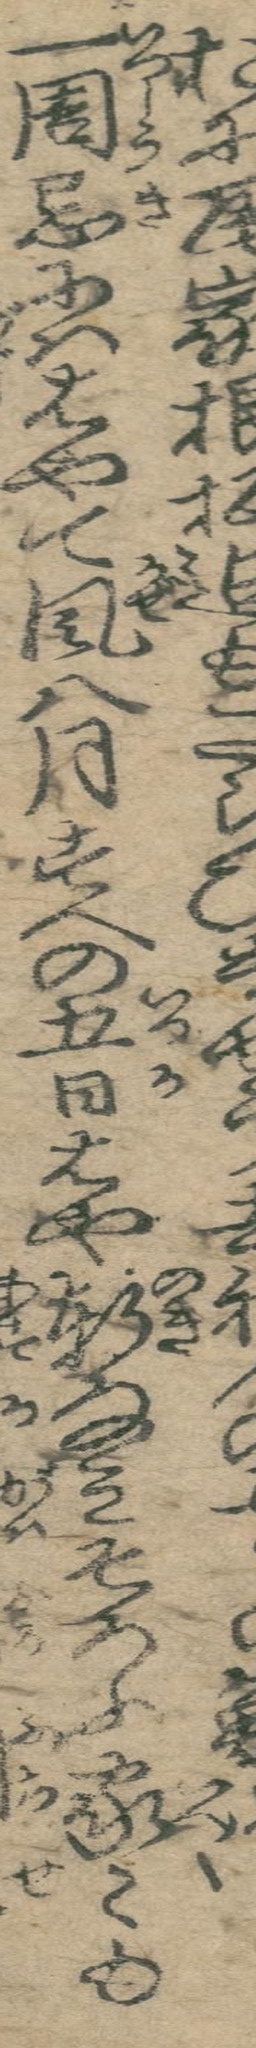一周忌にははやて風八月すへの五日はや軒なみそろふ家〻も
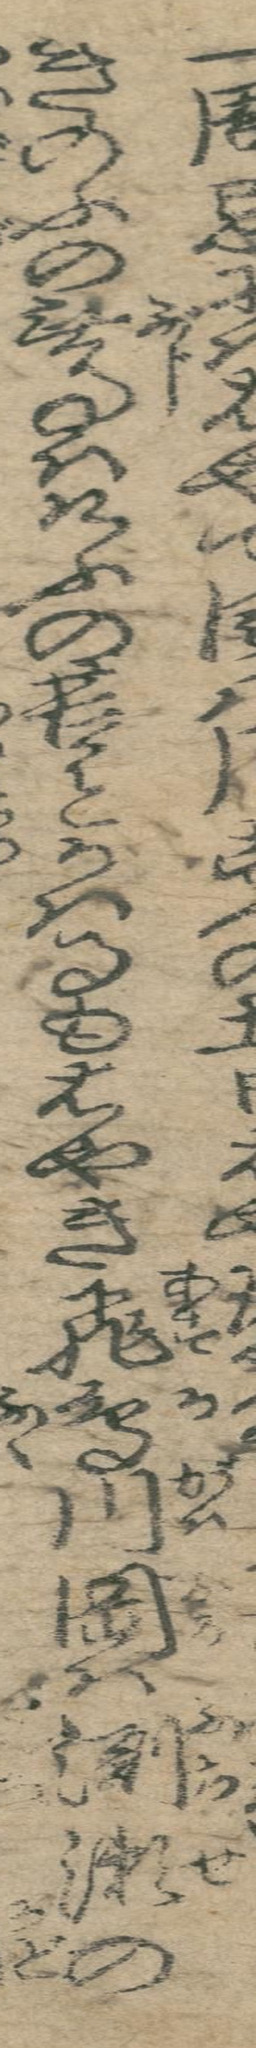きのふの無事はけふの苦とかはるもはやき飛鳥川岡は渕瀬の
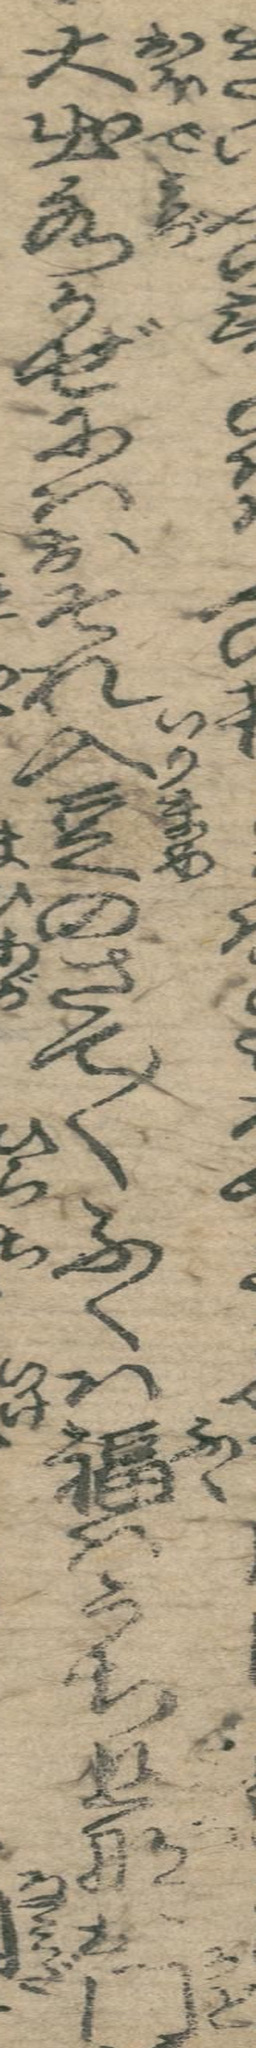大出水かぜにはおそれ入豆のさて〳〵ふくは福はうち懇なお門を
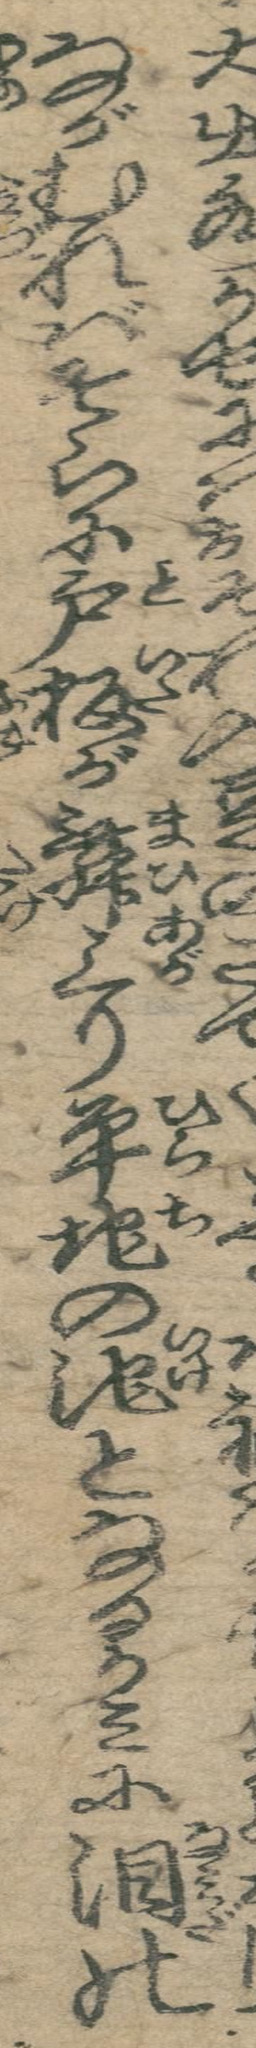ながむればそらに戸板が舞上り平地の池となるうみに泪の
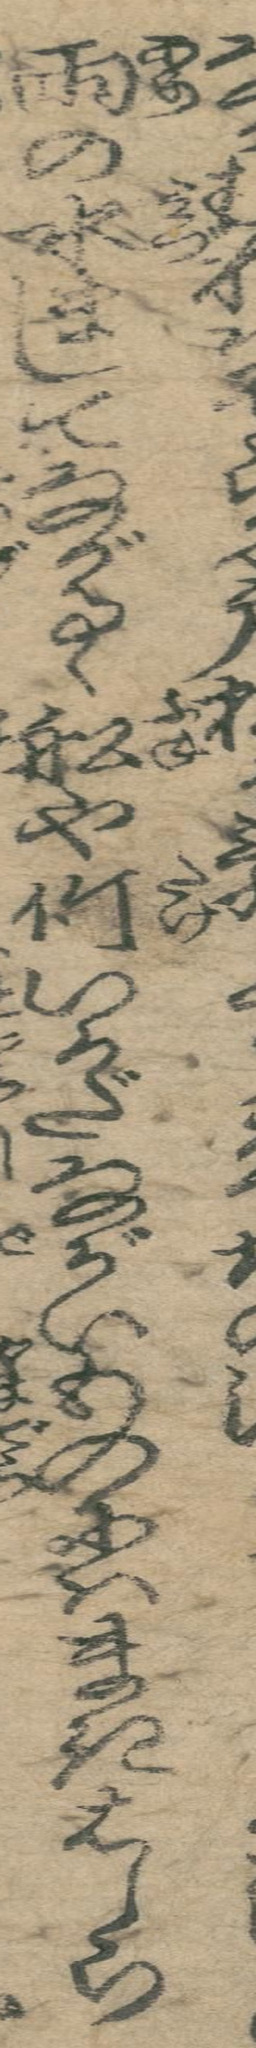雨の水ましてながるゝ船や竹いかだながいものにはまきはしら
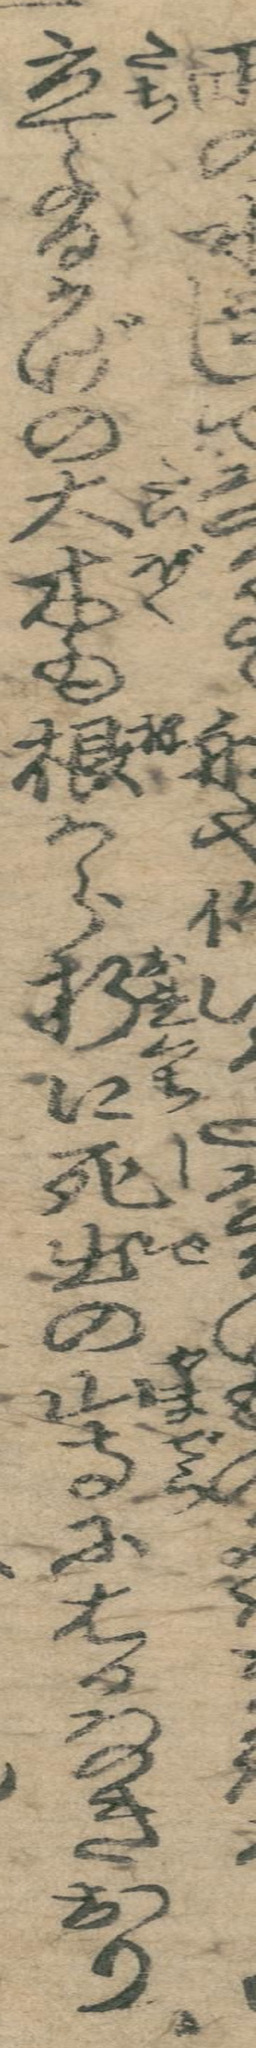立よるかげの大木も根から折口死出の山寺にはかなきおり
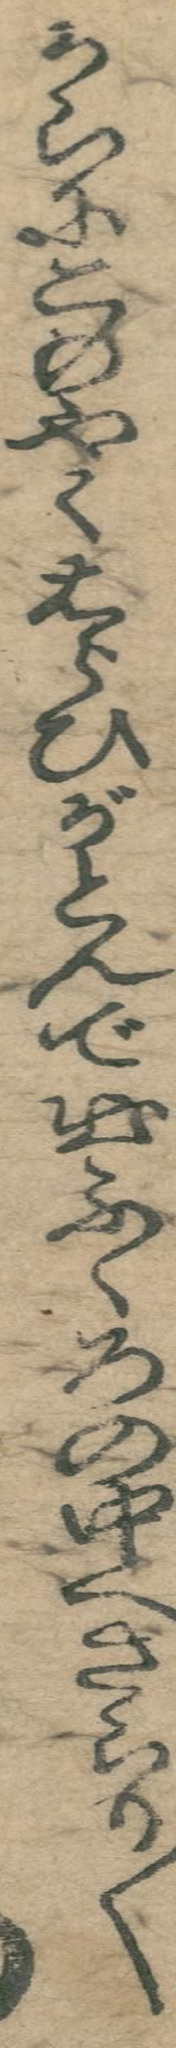からにともやくはらひがとんで出ふくろの中へさらり〳〵
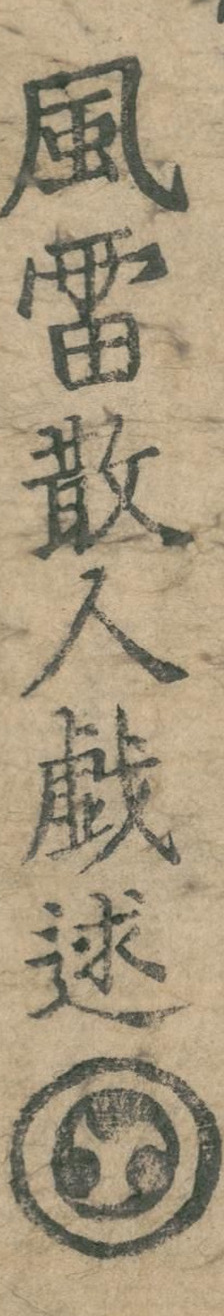風雷散人戯述紋
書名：家苦はらい
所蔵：東京大学地震研究所図書室 Earthquake Research Institute Library, The University of Tokyo, JAPAN
